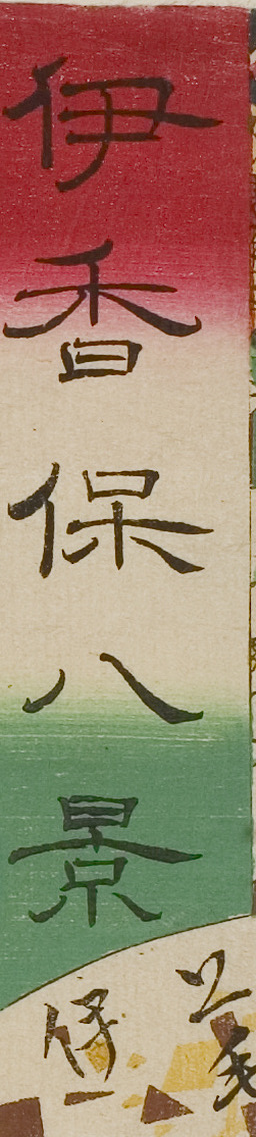伊香保八景
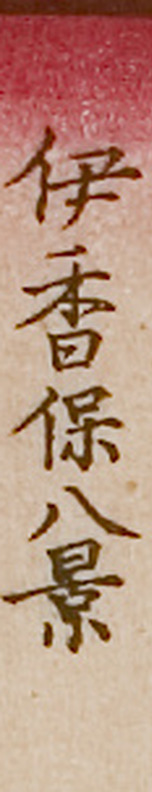伊香保八景

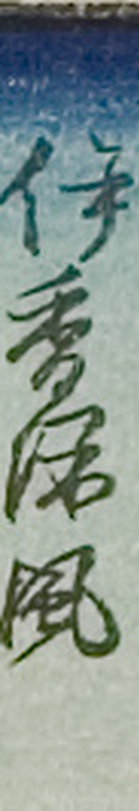伊香保風
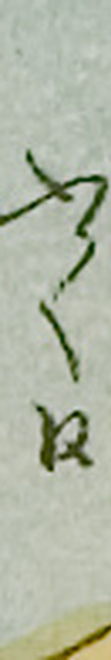ふく日

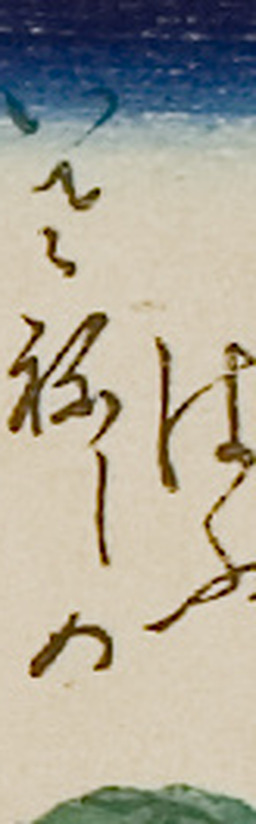いさねしめ
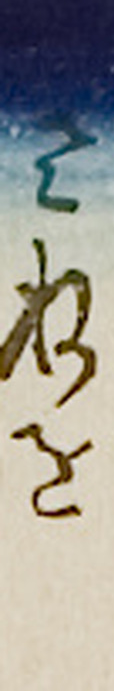さねを
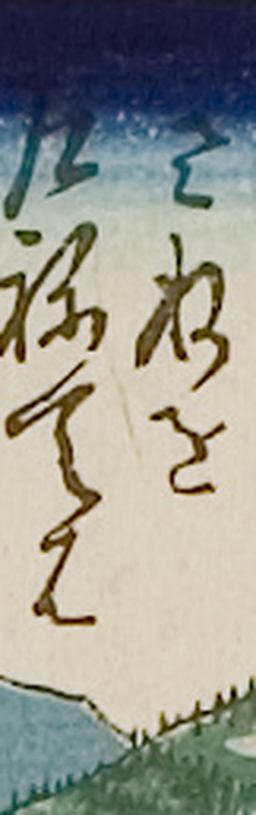さねては
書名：伊香保八景（袋）
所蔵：東京大学総合図書館 General Library in the University of Tokyo, JAPAN
